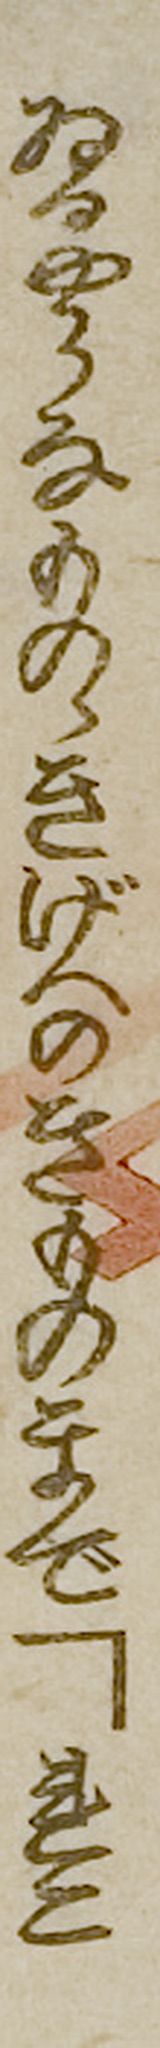ゐるやうなものゝきげへのきものまでれこ
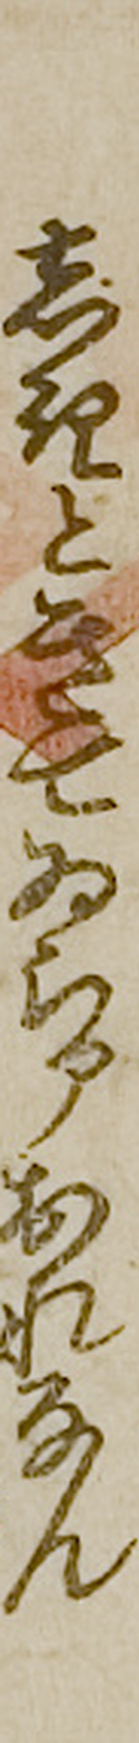しきときてゐらァおれなん
